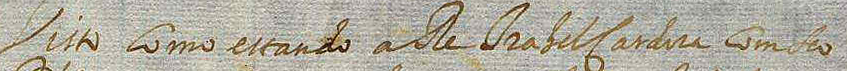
Visto Como estando a Re Izabel Cardoza Com seo
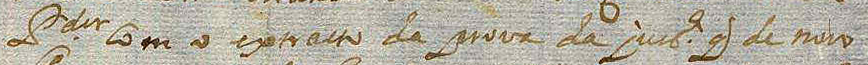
P.dor com o extracto da prova da just.a q̄ de novo
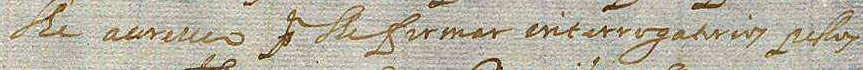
lhe accreceo p.a lhe formar interrogatorios pellos
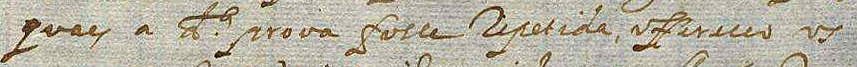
quaes a d̄.a prova fosse Repetida, offereceo os
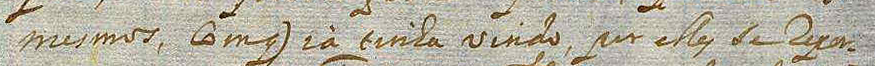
mesmos, com q̄ ia tinha vindo, por elles se Reper
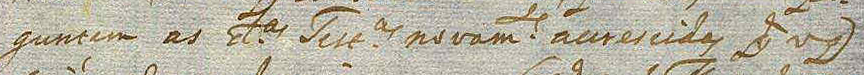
guntam as d̄.as Test.as novam.te acrescidas p.a o q̄
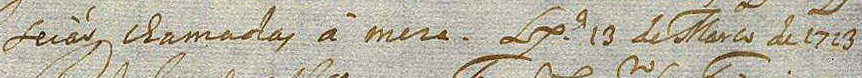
seiaõ, chamadas ā meza. Lx.a 13 de Março de 1713
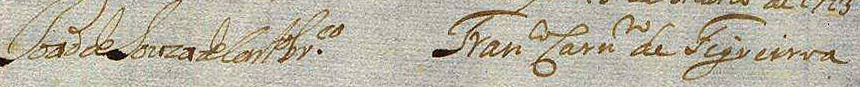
Ioaõ de Souza de Cast.obr.co Franco Carn.ro de Figueiroa
